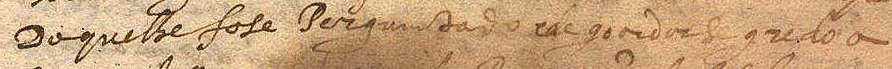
Do que lhe fose Perguntado e de goardar segredo a
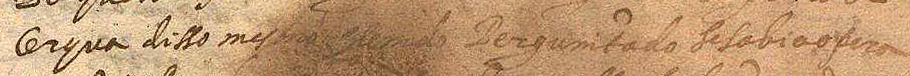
cerqua disso mesmo e sendo Pergumtado se sabia o pera
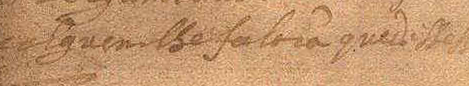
alguem lhe falara que dissesse
